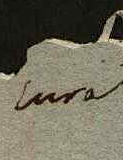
Cura
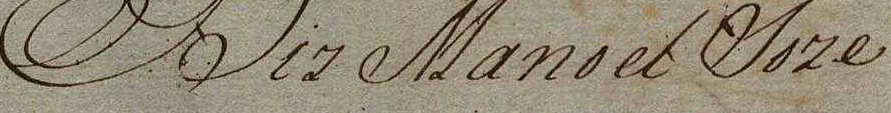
Diz Manoel Ioze
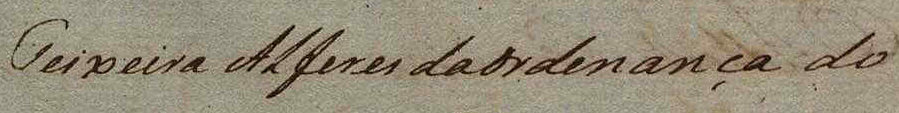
Teixeira Alferes da ordenança do
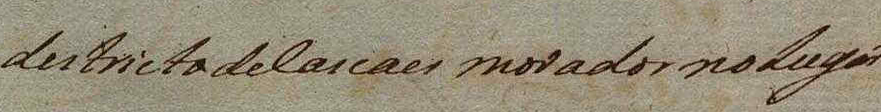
destricto de Cascaes morador no Lugar
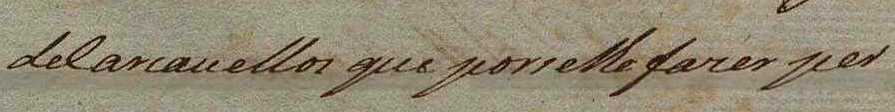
de Carcauellos que por se lhe fazer per
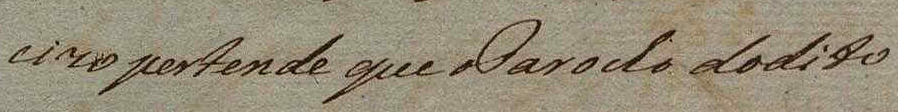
cizo pertende que o Parocho do dito
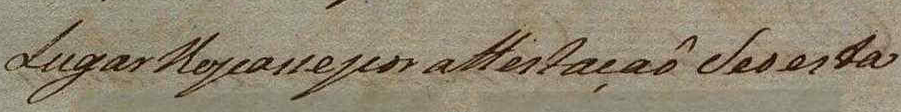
Lugar lhes passe por attestaçaõ seo esta
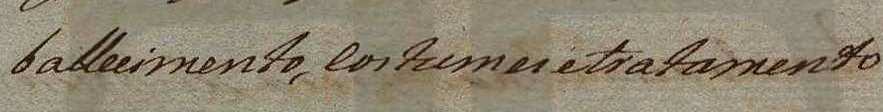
ballecimento, costumes e tratamento
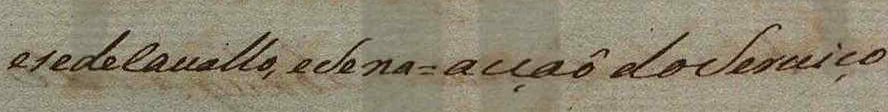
e se de cauallo, e se na = acçaõ do Seruiço
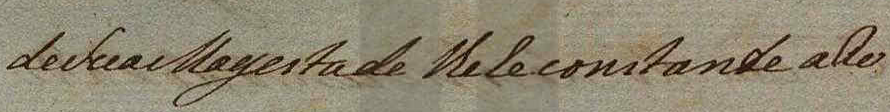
de sua Magestade lhe he constante a Re
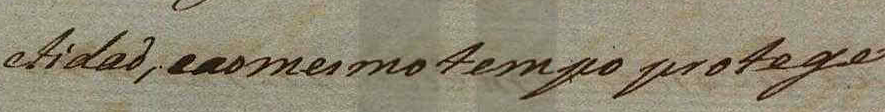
ctidaõ, e ao mesmo tempo protege
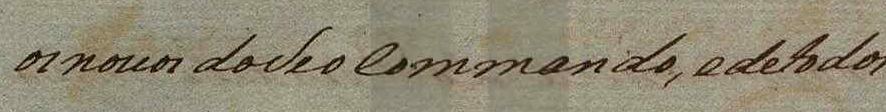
os nouos do Seo commando, e de todos
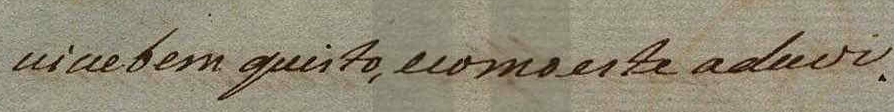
uiue bem quisto, e como este a duvi
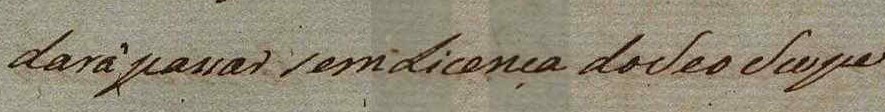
dará passar sem Licença do seo supe
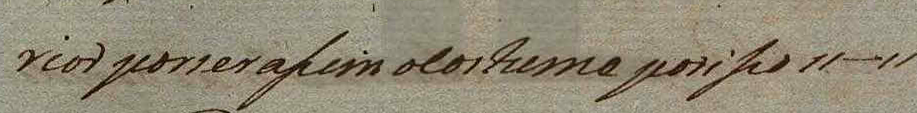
rior por ser assim o costume por isso //-//
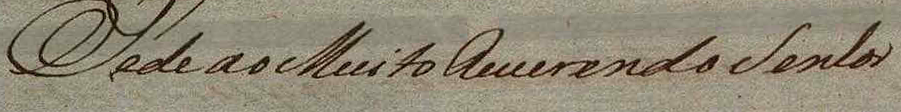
Pede ao Muito Reuerendo Senhor
